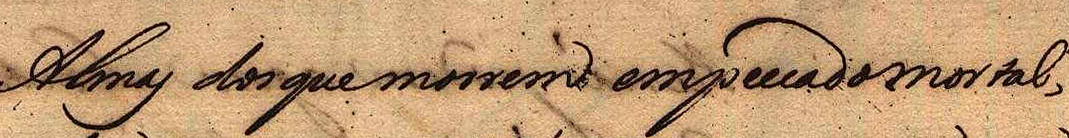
Almas dos que morrem em peccado mortal,
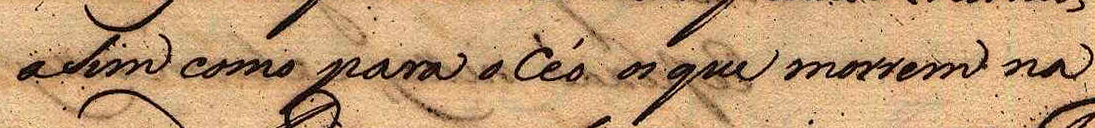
asim como para o céo os que morrem na
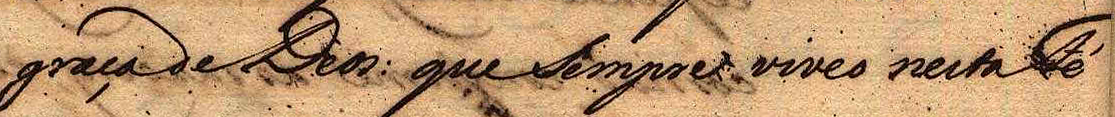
graça de Deos: que sempre viveo nesta Fé
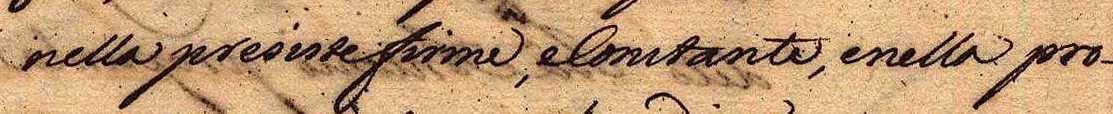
nella presiste firme, e Constante, e nella pro
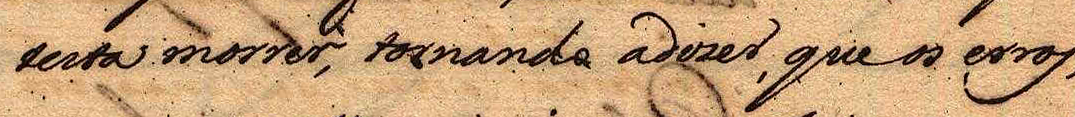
testa morrer, tornando a dizer, que os erros,
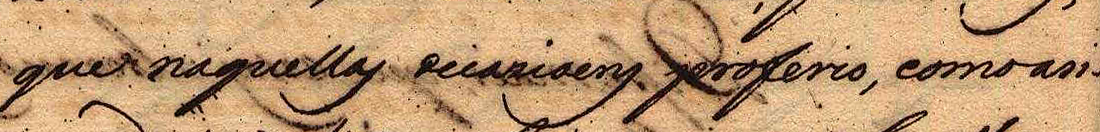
que naquellas occazioens proferio, como asi
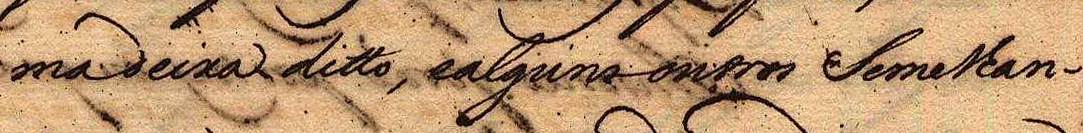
ma deixa ditto, e alguns outros Semelhan
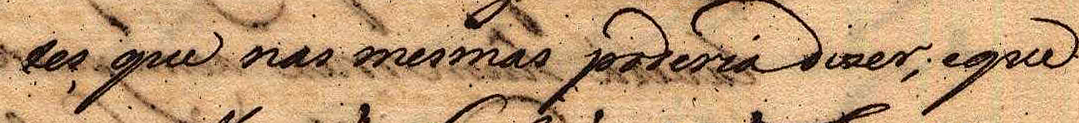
tes, que nas mesmas poderia dizer; e que
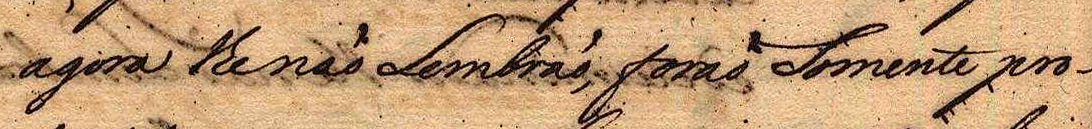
agora lhe naõ Lembraõ, foraõ somente pro
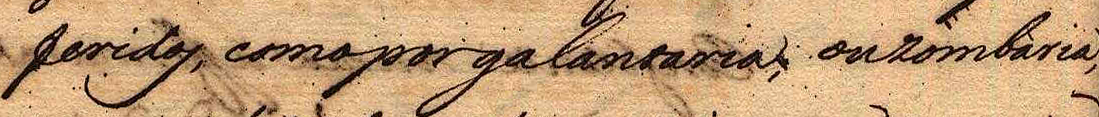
feridos, como por galantaria; ou zombaria,
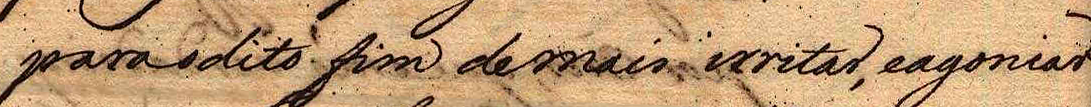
para o dito fim de mais irritar, e agoniar
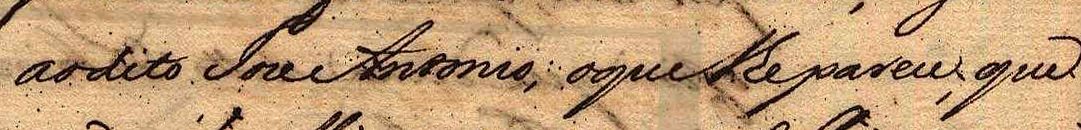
ao dito Ioze Antonio; o que lhe parece, que
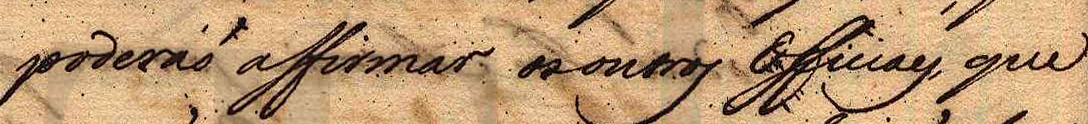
poderaõ affirmar os outros Officiaes, que
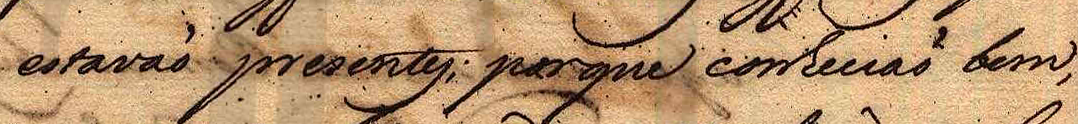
estavaõ presentes; porque conheciaõ bem,
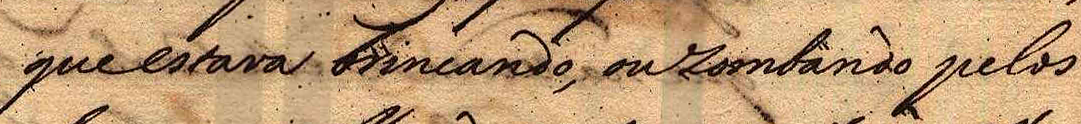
que estava brincando, ou zombando pelos
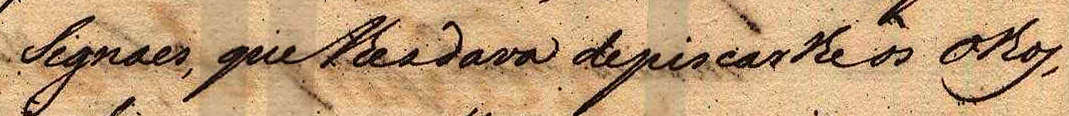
Signaes, que lhes dava de piscarlhe os olhos,
